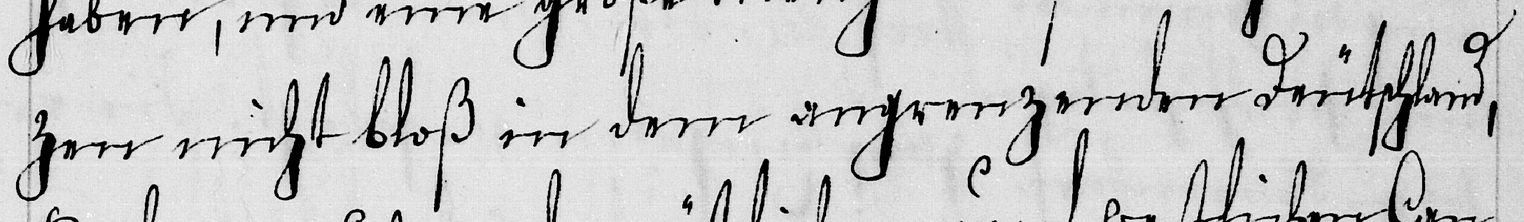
zen nicht bloß in dem angrenzenden Deutschland,
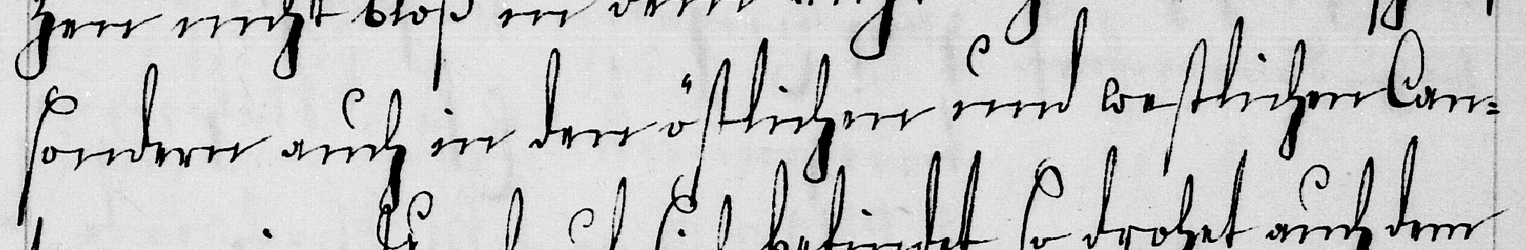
sondern auch in den östlichen und westlichen Can¬
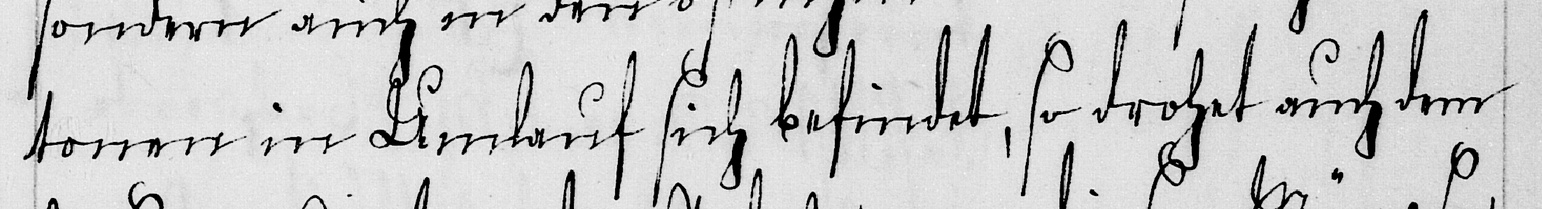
tonen in Umlauf sich befindet, so drohet auch dem
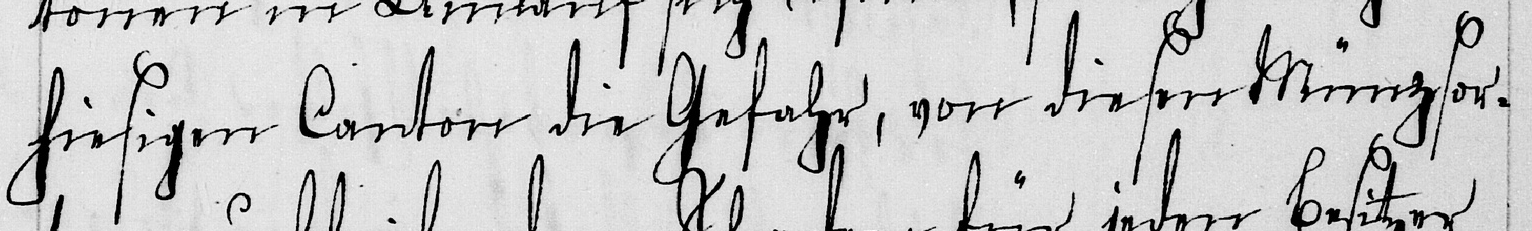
hiesigen Canton die Gefahr, von diesen Münzsor¬
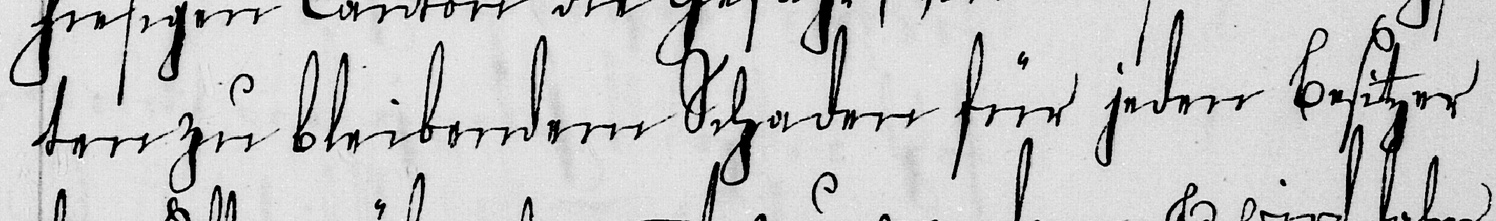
ten zu bleibendem Schaden für jeden Besitzer
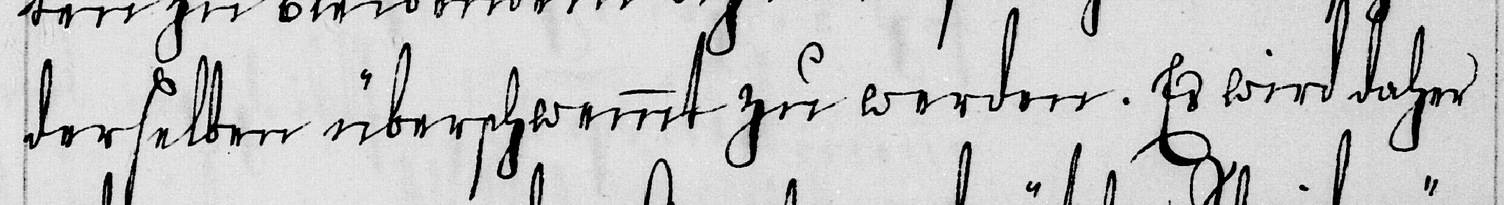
derselben überschwemmt zu werden. Es wird daher
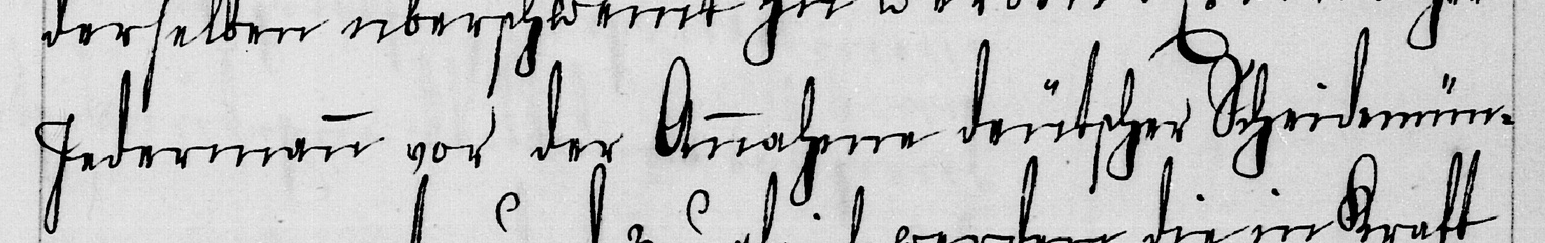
Jedermann vor der Annahme deutscher Scheidemün¬
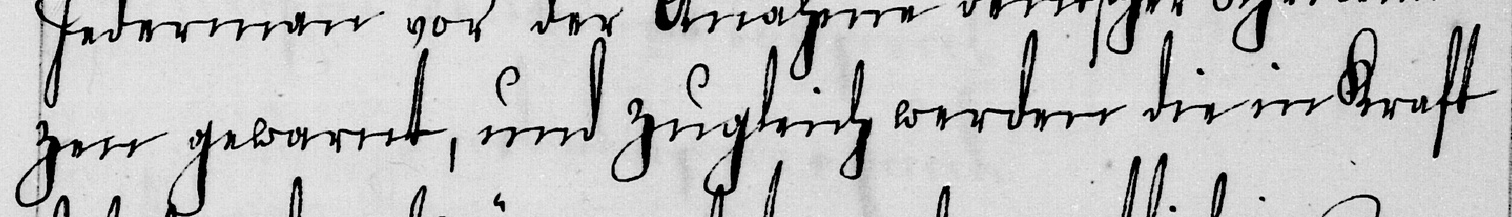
zen gewarnt, und zugleich werden die in Kraft
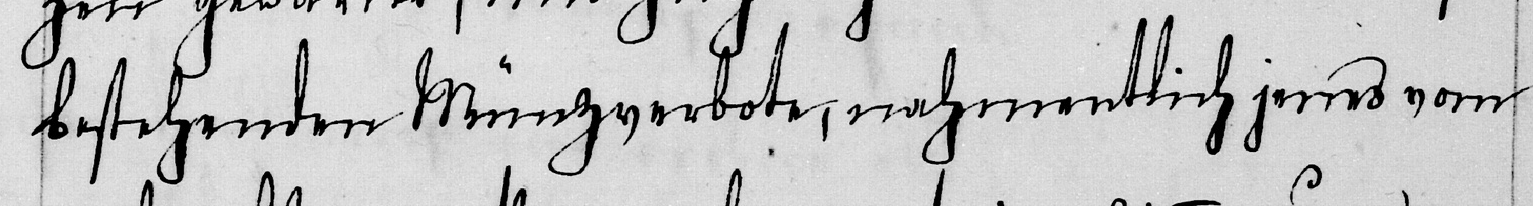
bestehenden Münzverbote, nahmentlich jenes vom
